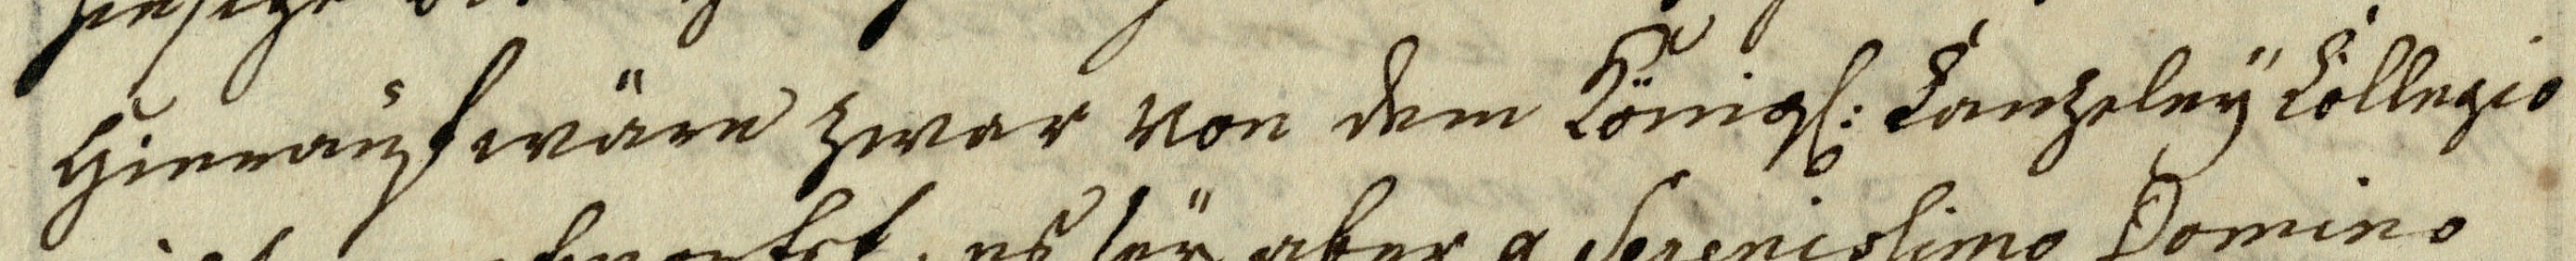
Hierauf wäre zwar von dem Königl. Canzeleÿ Collegio
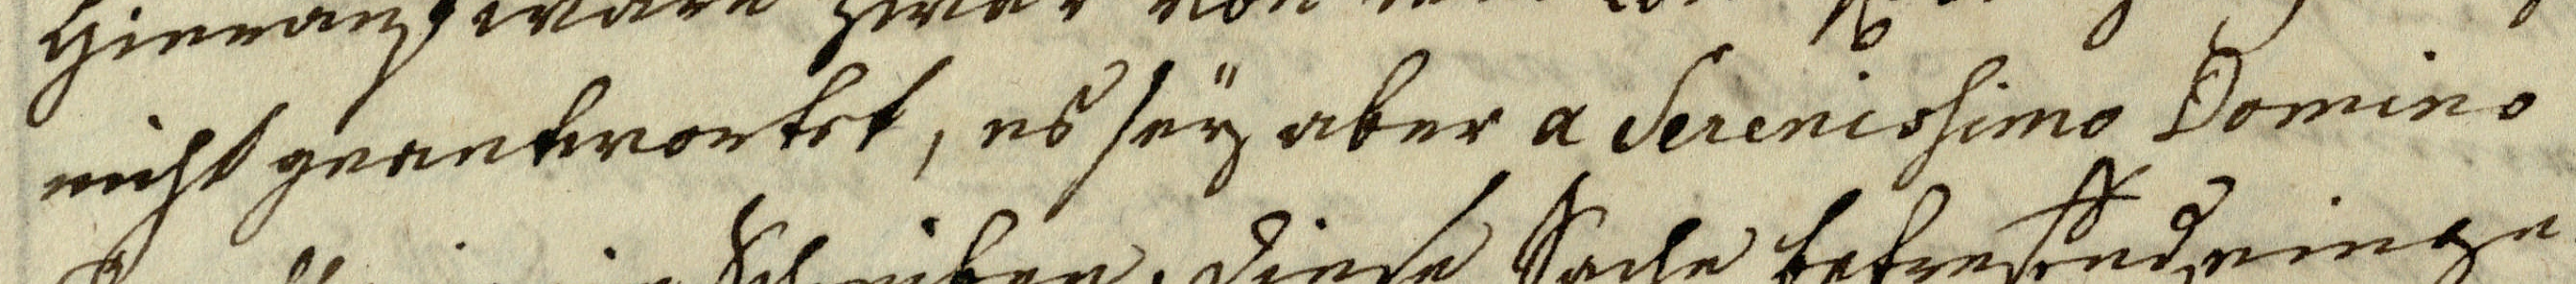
nicht geantwortet, es seÿ aber a Serenissimo Domino
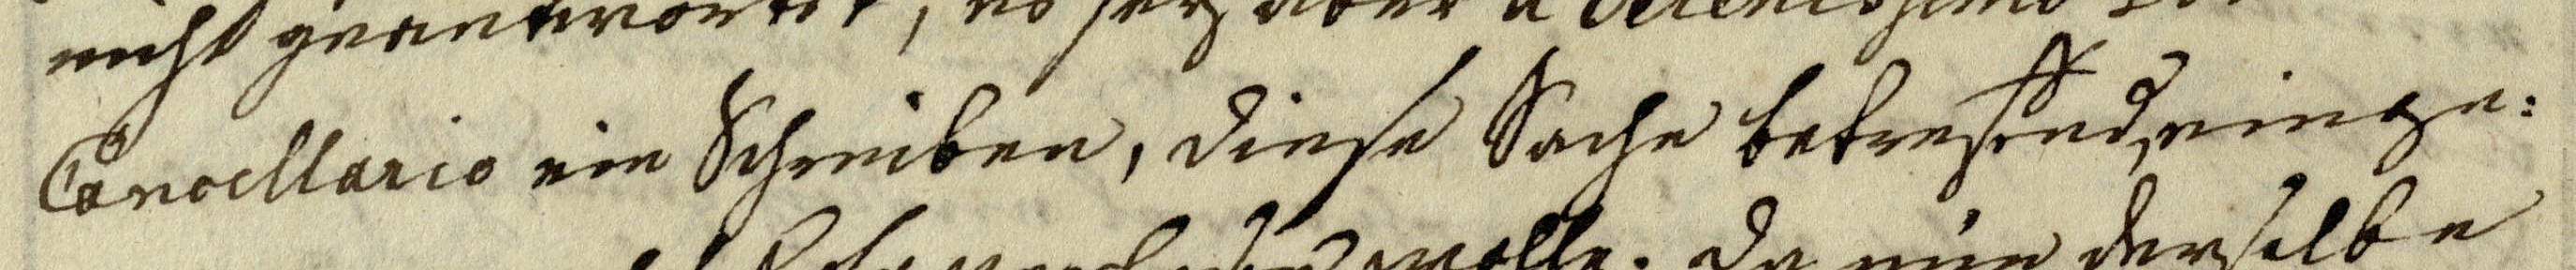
Cancellario ein Schreiben, diese Sache betreffend, einge¬
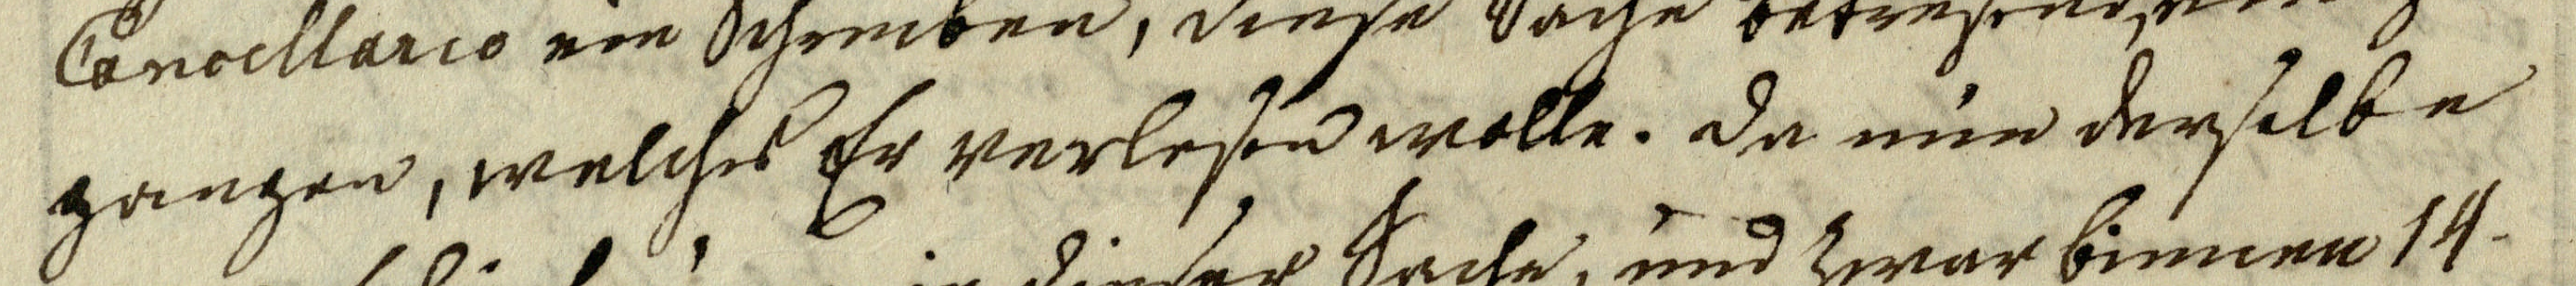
gangen, welches Er verlesen wolle. Da nun derselbe
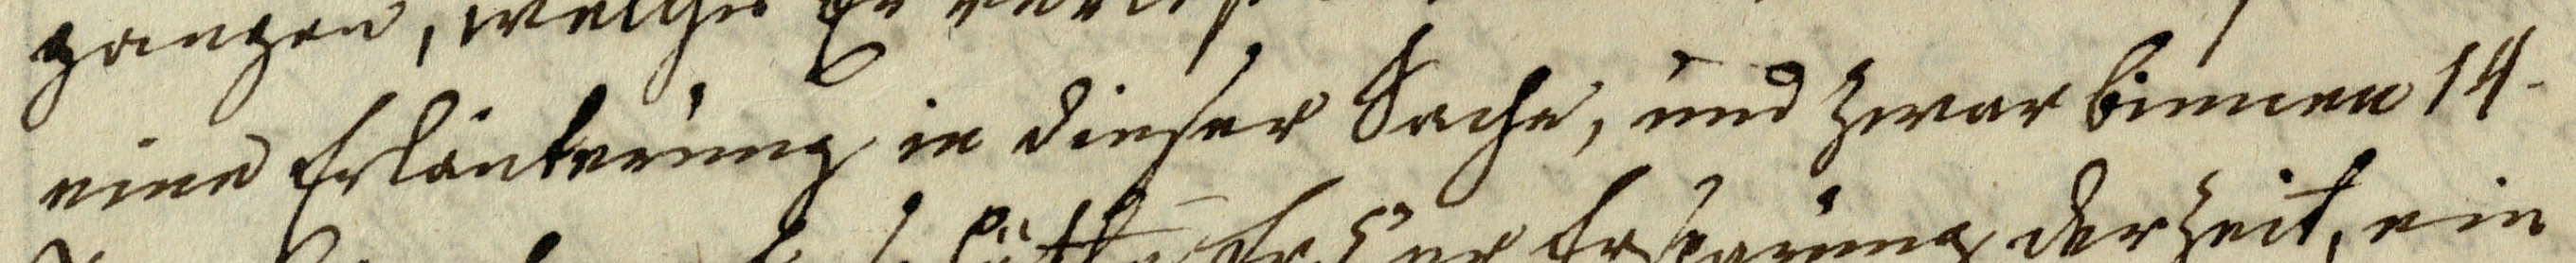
eine Erläuterung in dieser Sache, und zwar binnen 14-
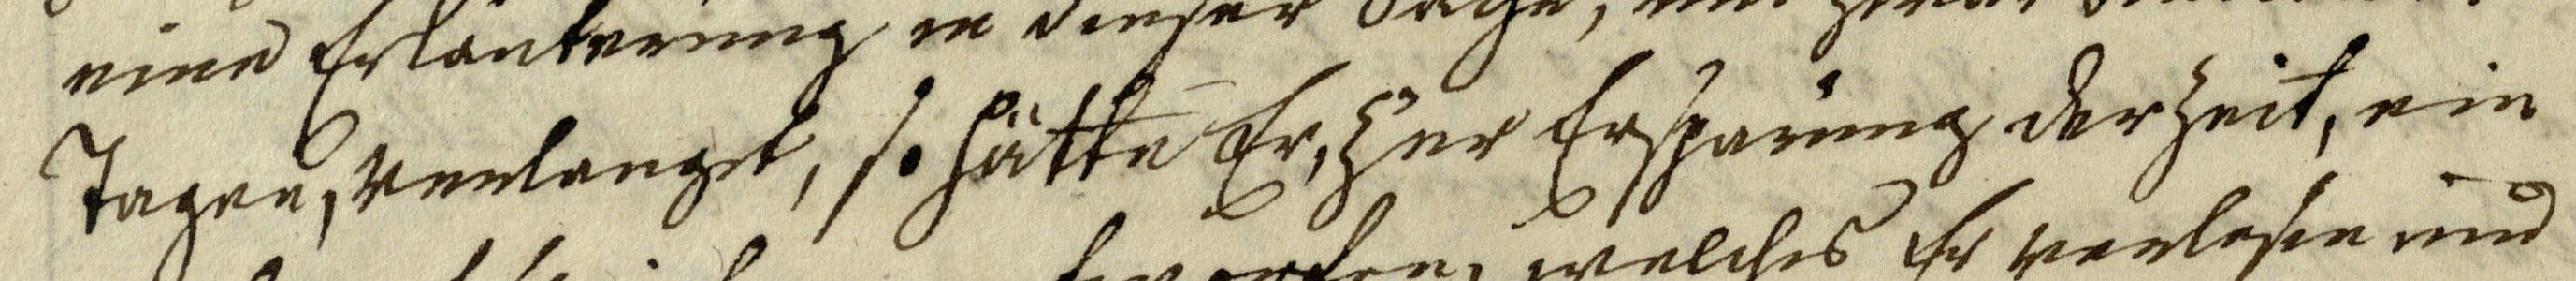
Tagen, verlanget, so hätte Er zur Ersparung der Zeit, ein
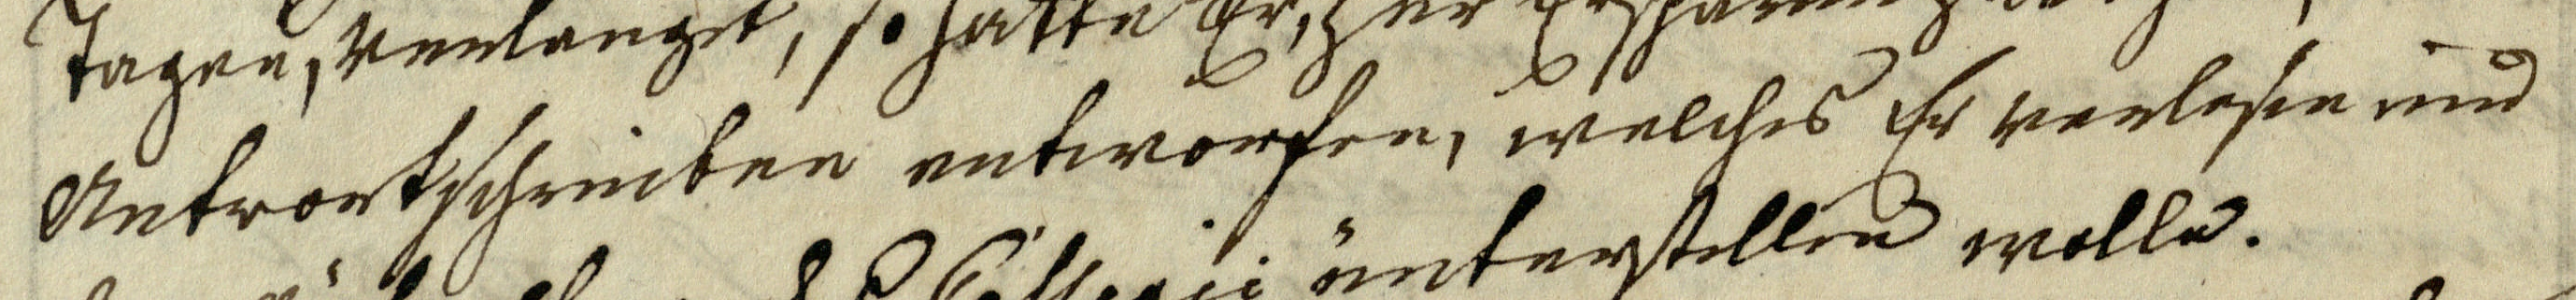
Antwortschreiben antworfen, welches Er verlesen und
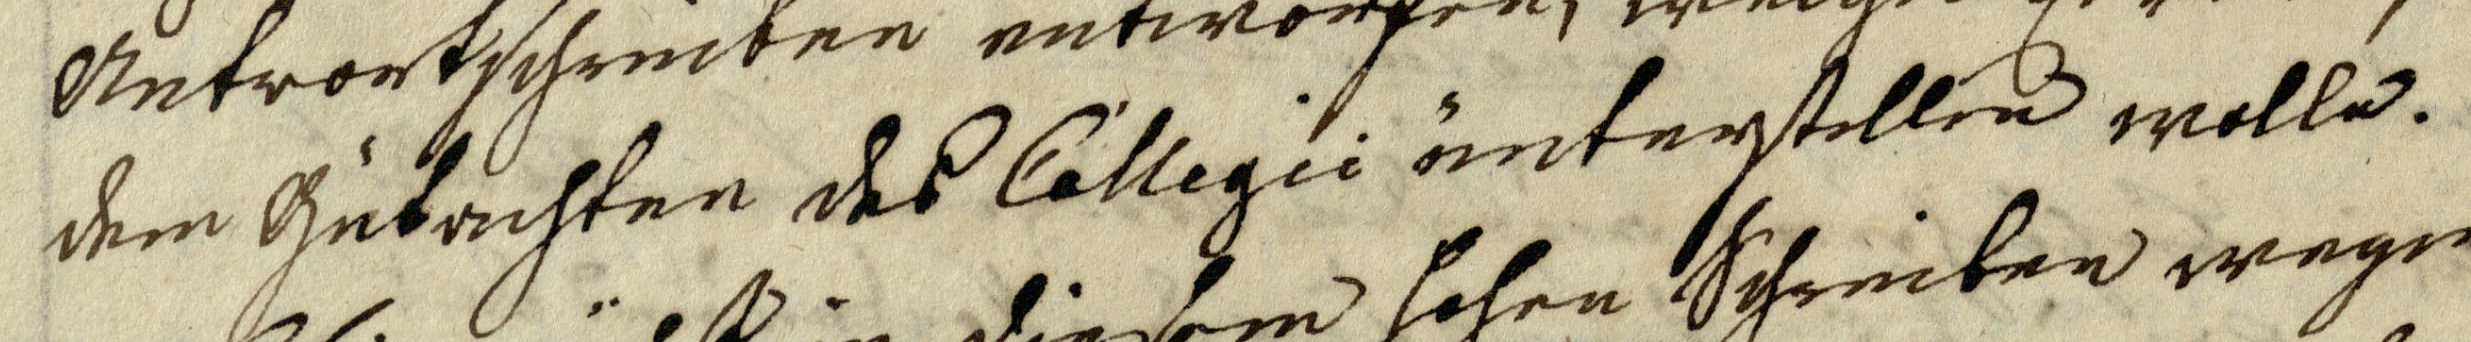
dem Gutachten des Collegii unterstellen wolle.
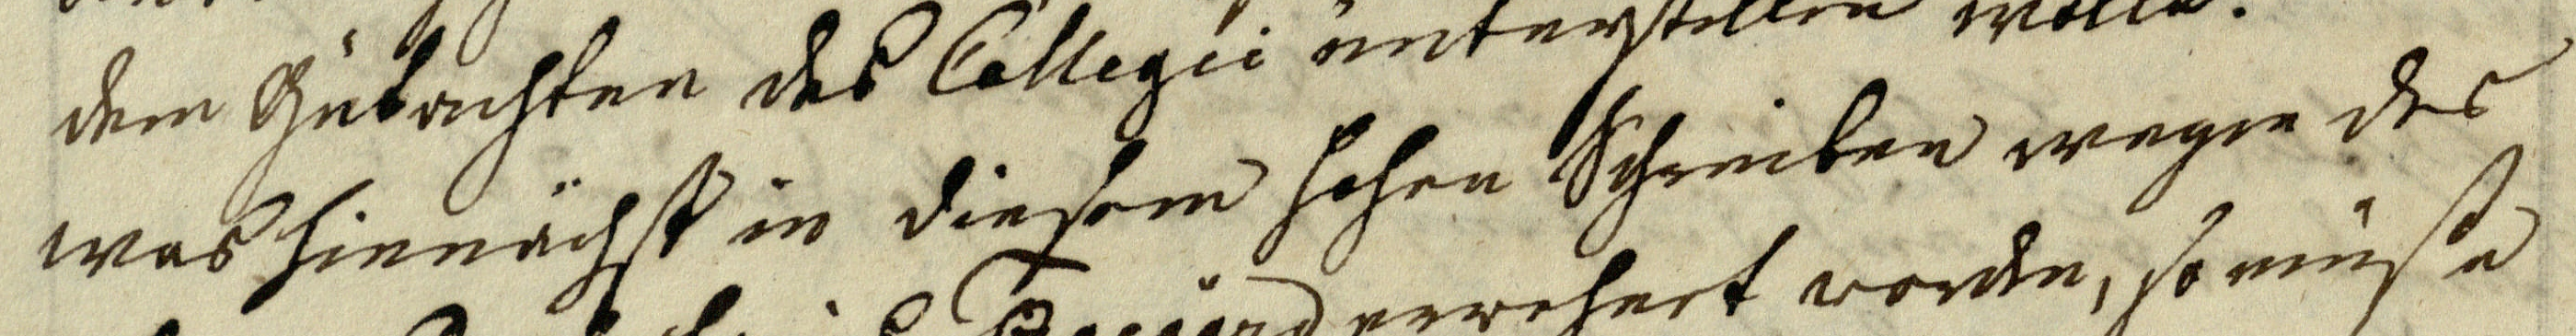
Was hienächst in diesem hohen Schreiben wegen des
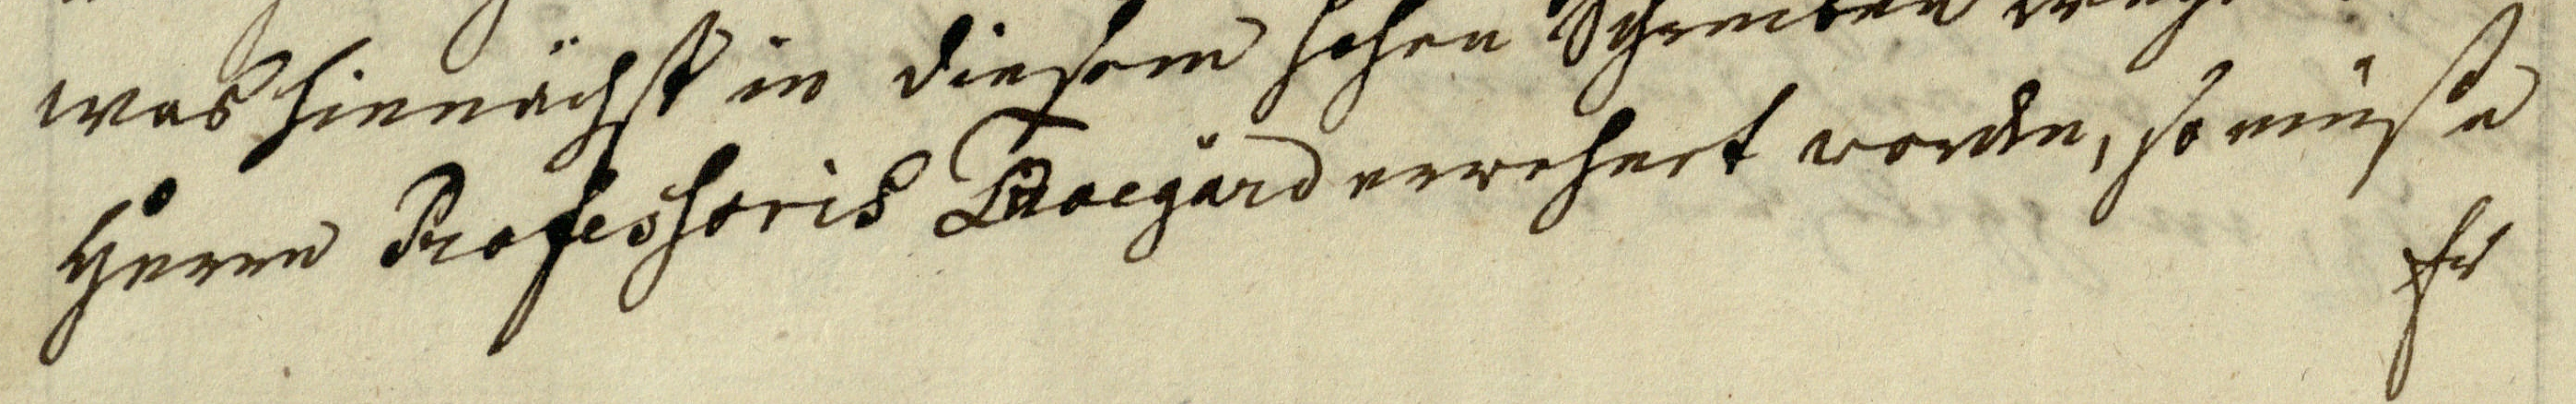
Herrn Professoris Traegård erwehnet worden, so müße Er
